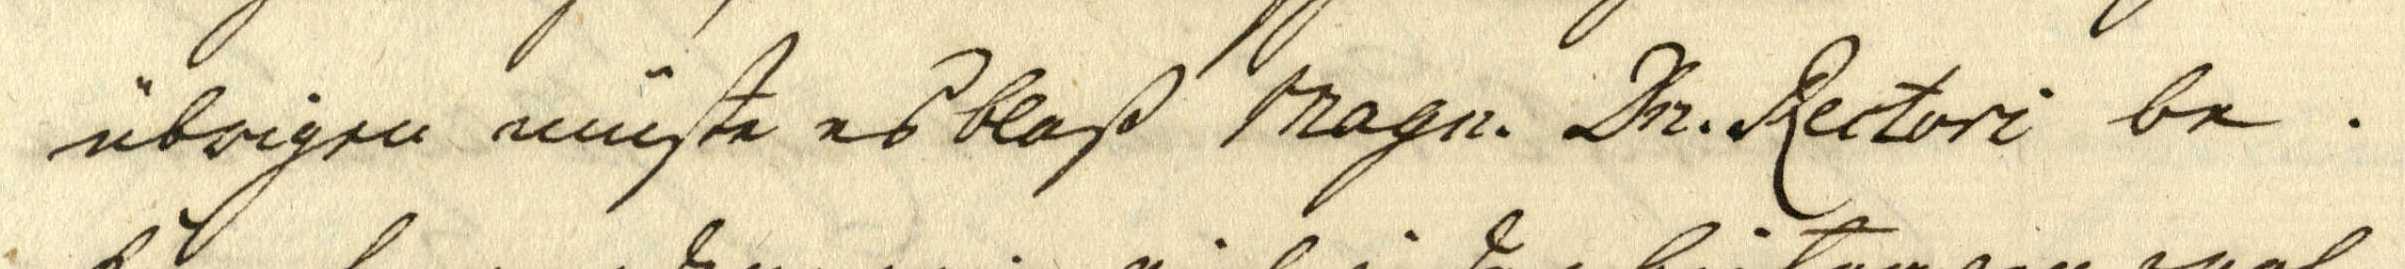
übrigen müste es bloß Magn. Dn. Rectori be-
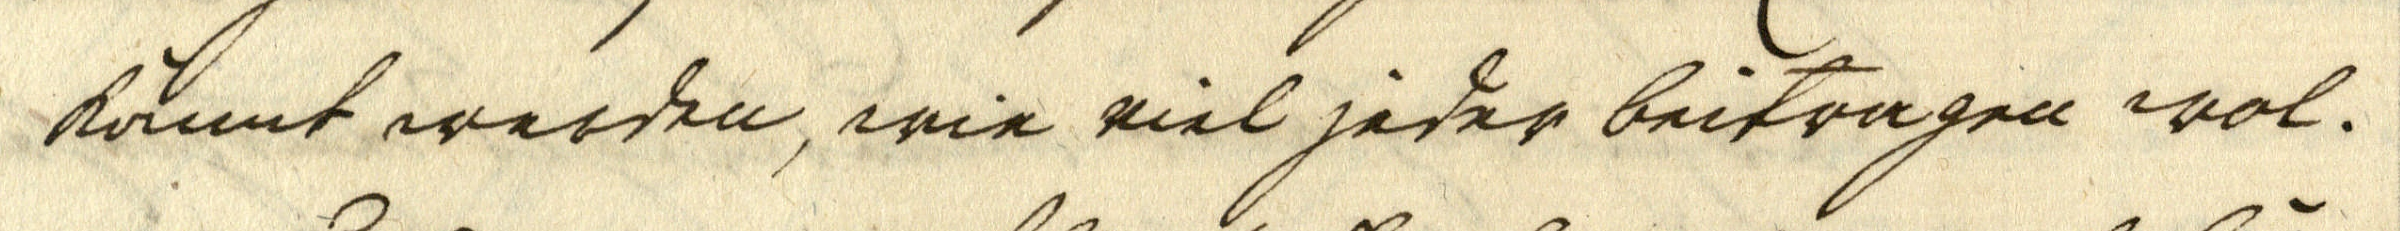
kannt werden, wie viel jeder beitragen wol-
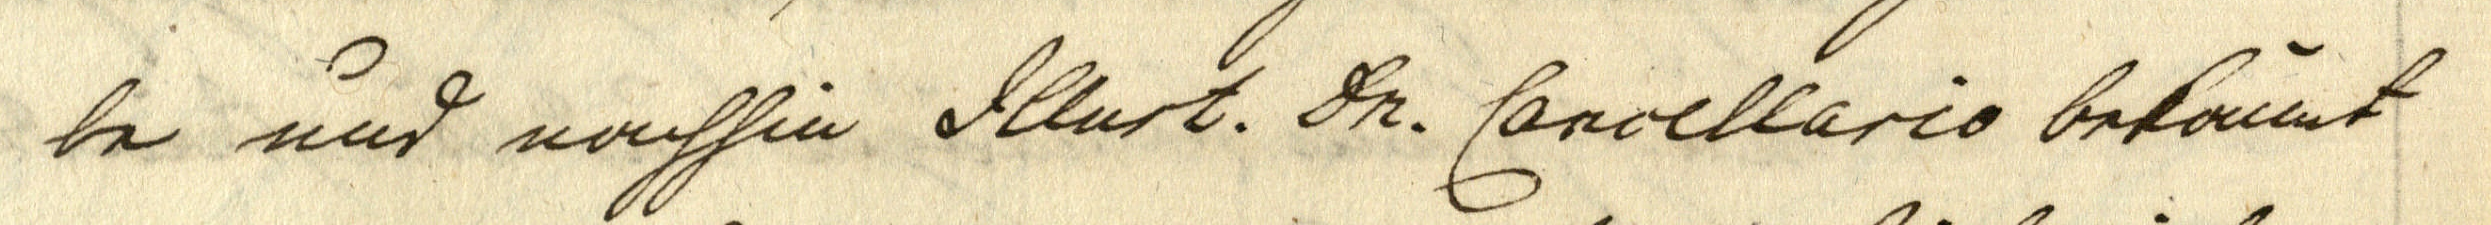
le und nachhin Illust. Dn. Cancellario bekannt
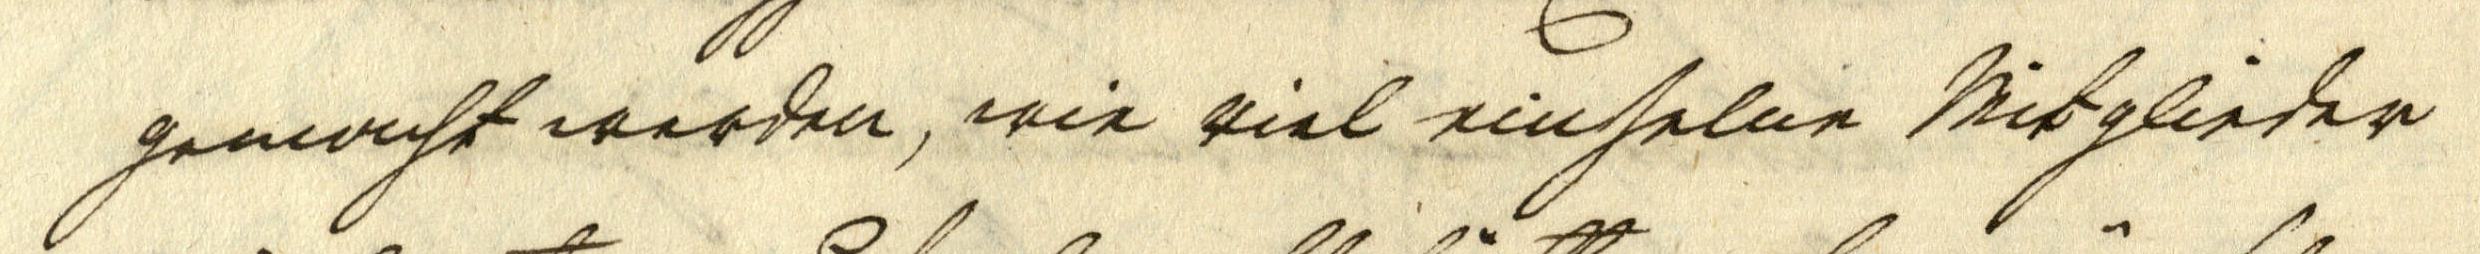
gemacht werden, wie viel einzelne Mitglieder
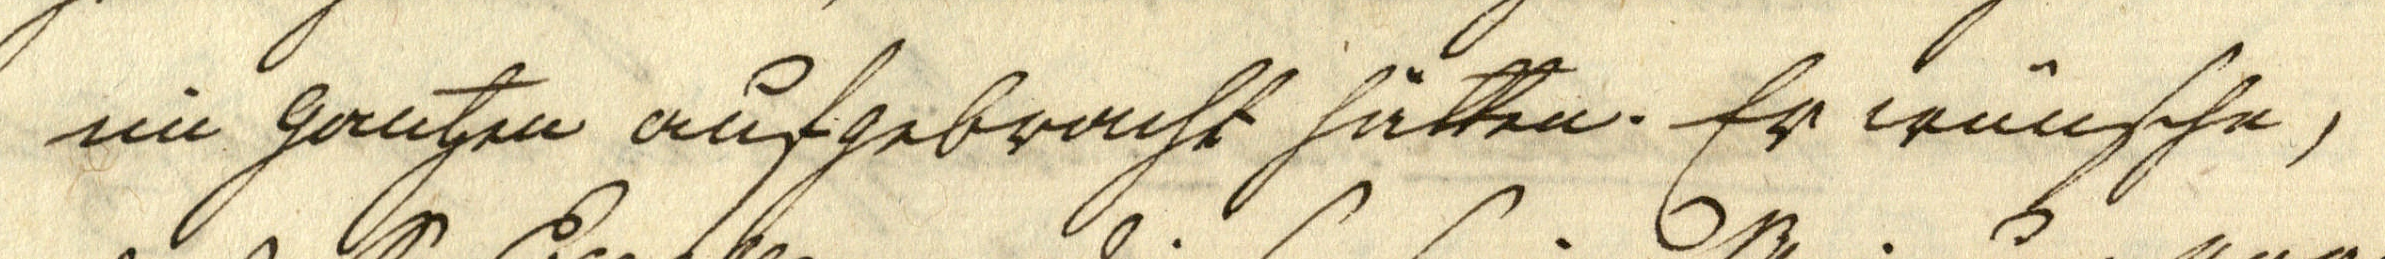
im Gantzen aufgebracht hätten. Er wünsche,
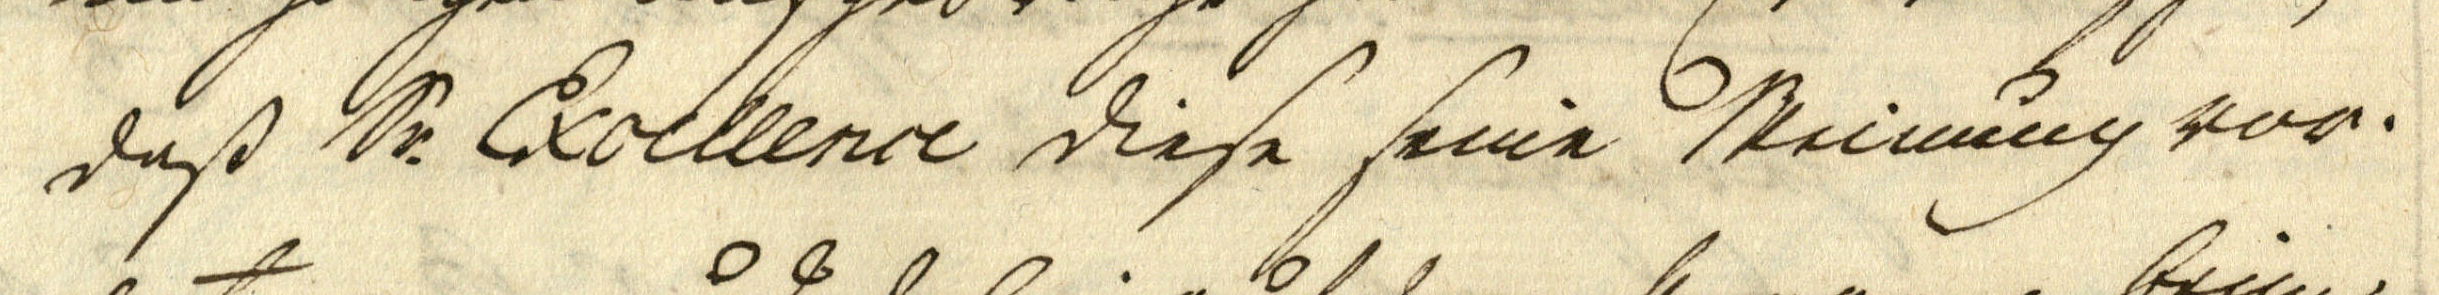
daß Sr. Excellence diese seine Meinung vor-
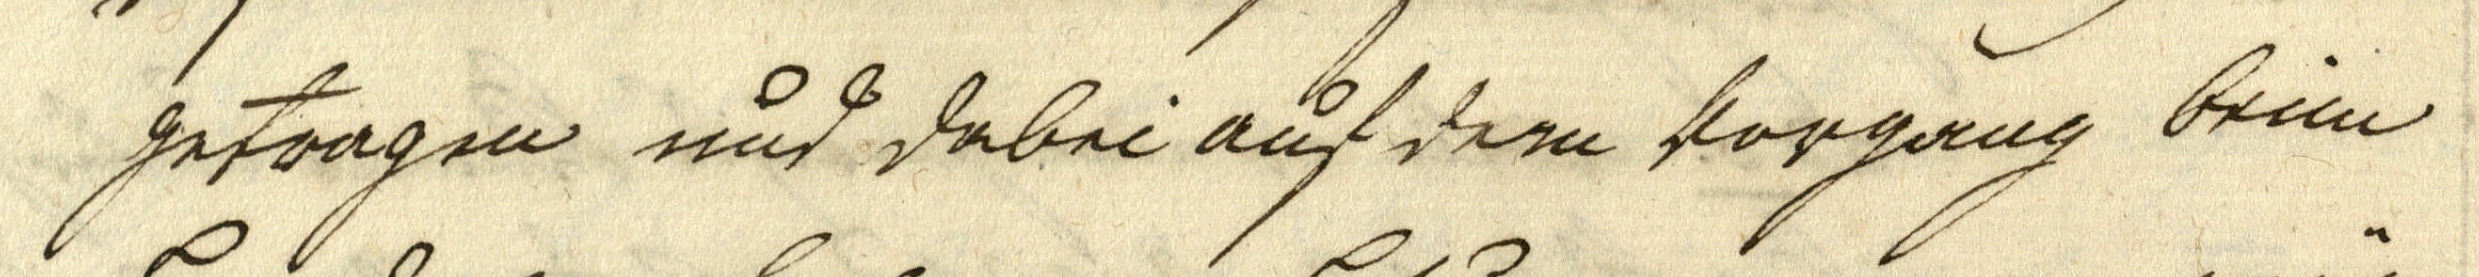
getragen und dabei auf dem Vorgang
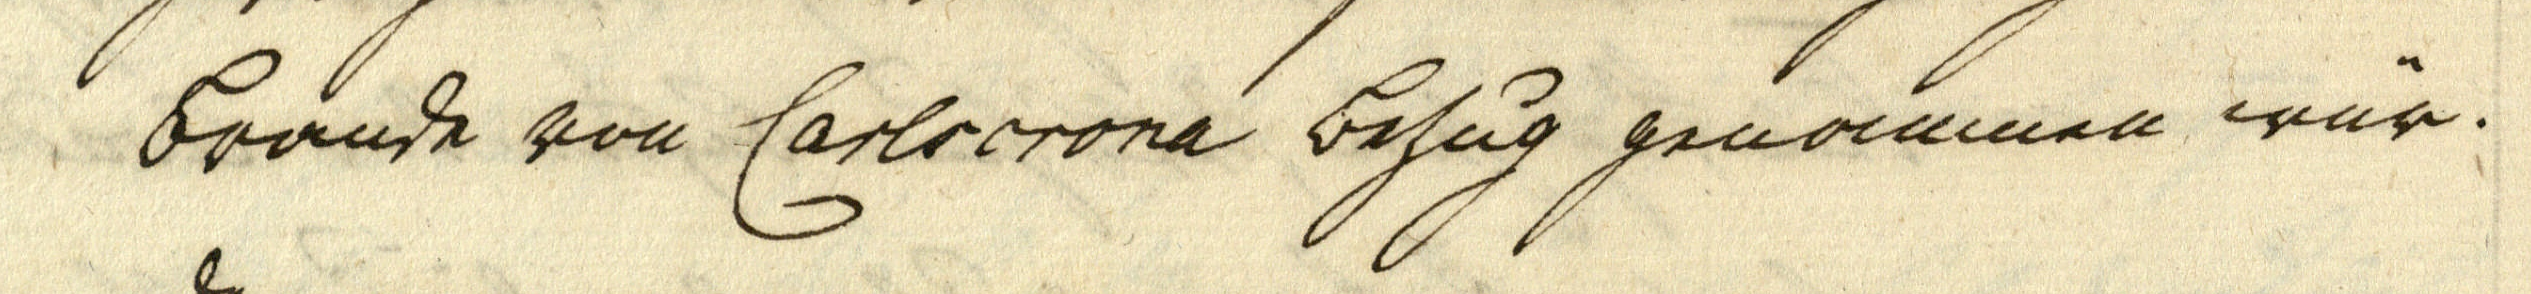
beim Brande von Carlscrona Bezug genommen wür-
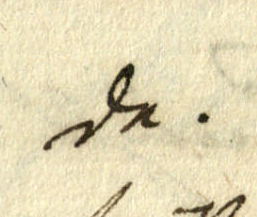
de.
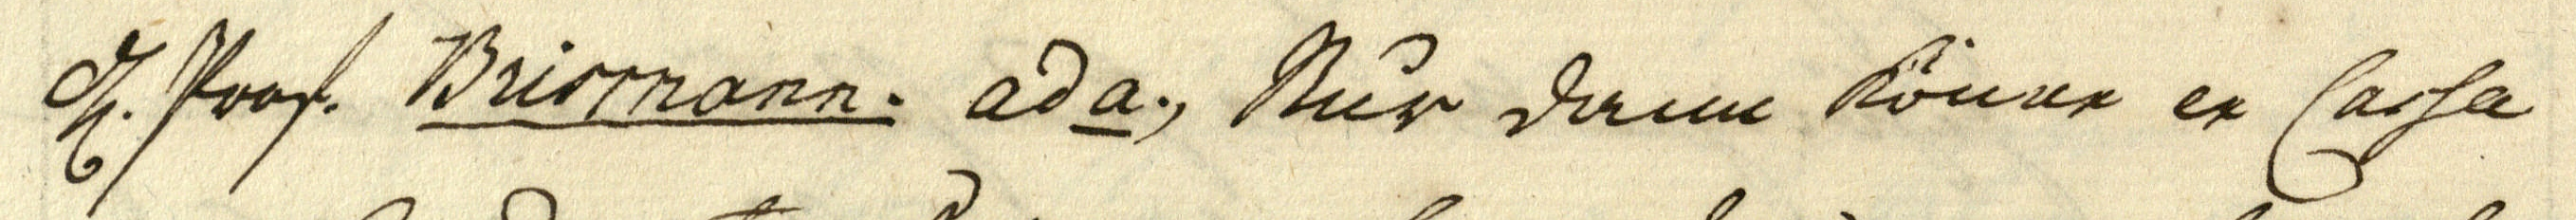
dh. Prof. Brismann. ad a.) Nur dann könne ex Cassa
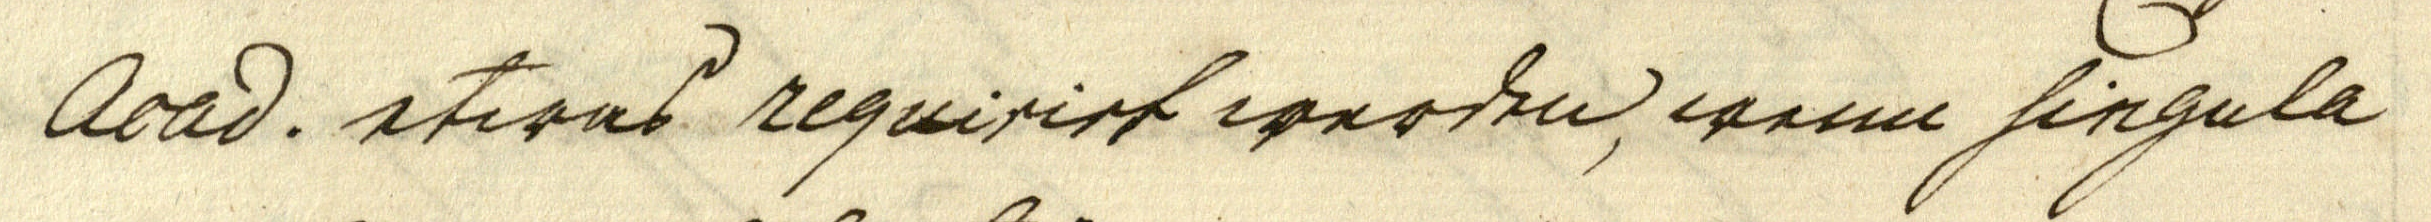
Acad. etwas requirirt werden, wenn singula
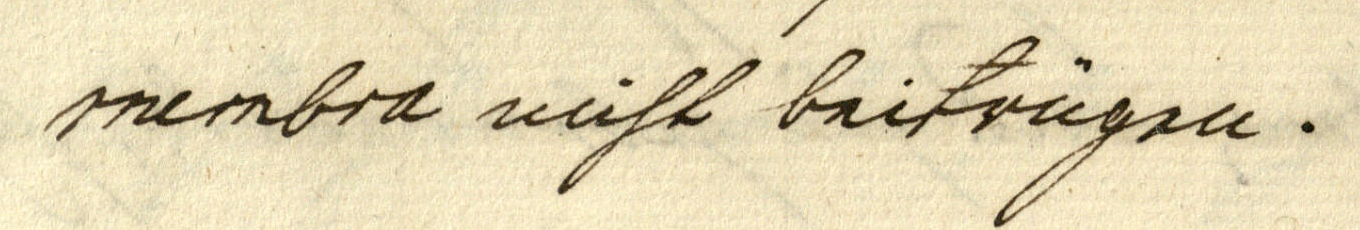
membra nicht beitrügen.
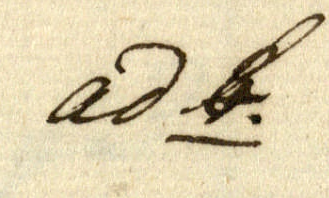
ad b.
